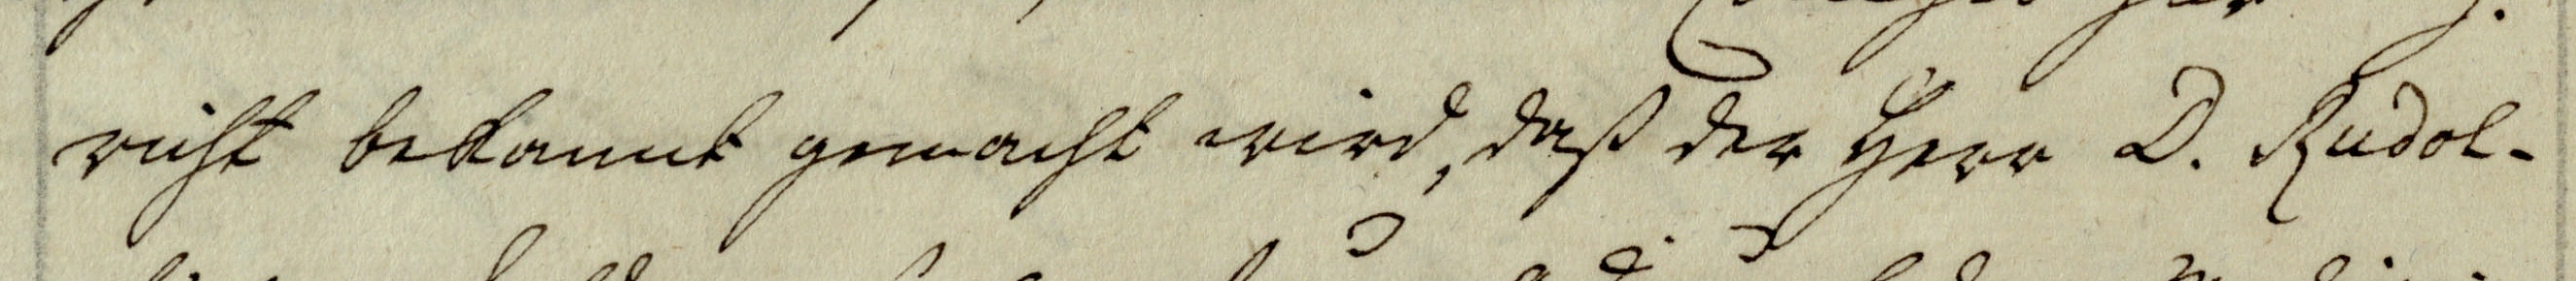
richt bekannt gemacht wird, daß der Herr D. Rudol¬
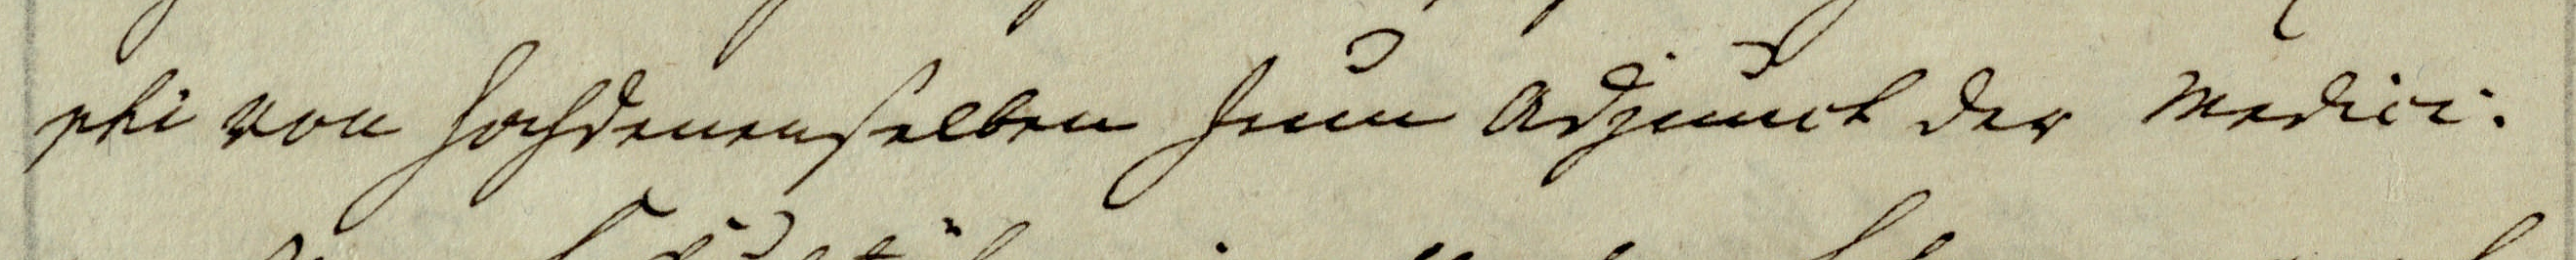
phi von Hochdenenselben zum Adjunct der Medici¬
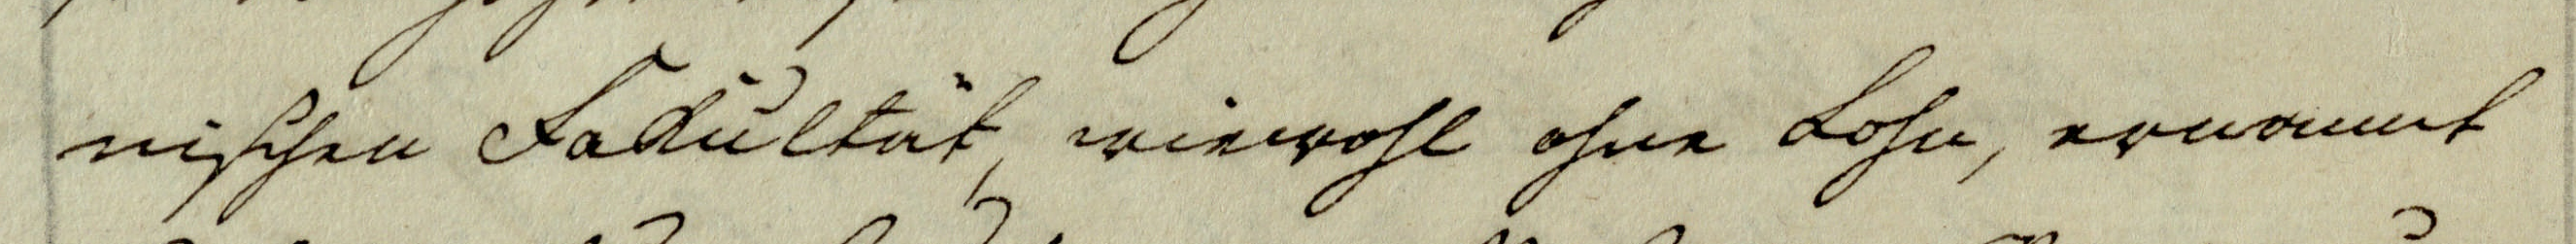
nischen Fakultät, wiewohl ohne Lohn, ernannt
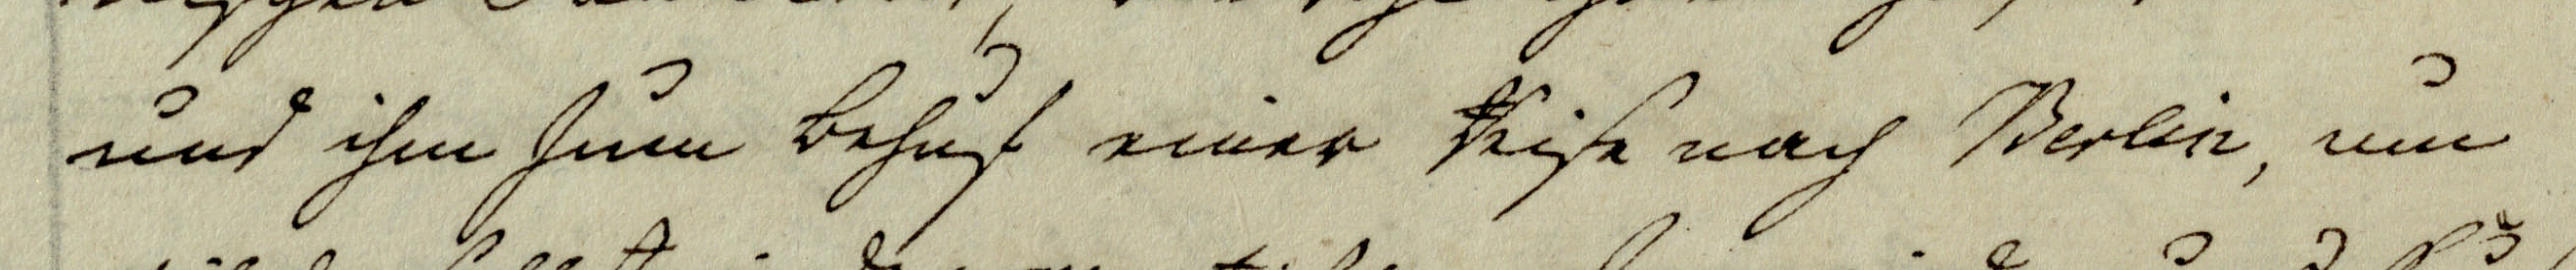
und ihm zum Behuf einer Reise nach Berlin, um
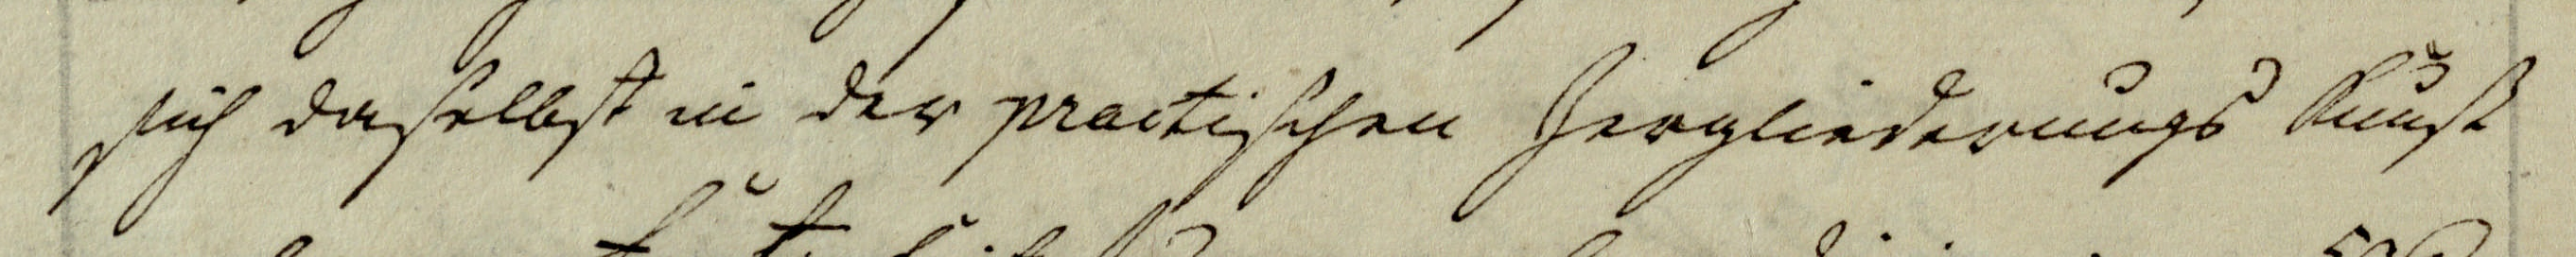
sich daselbst in der practischen Zergliederungs Kunst
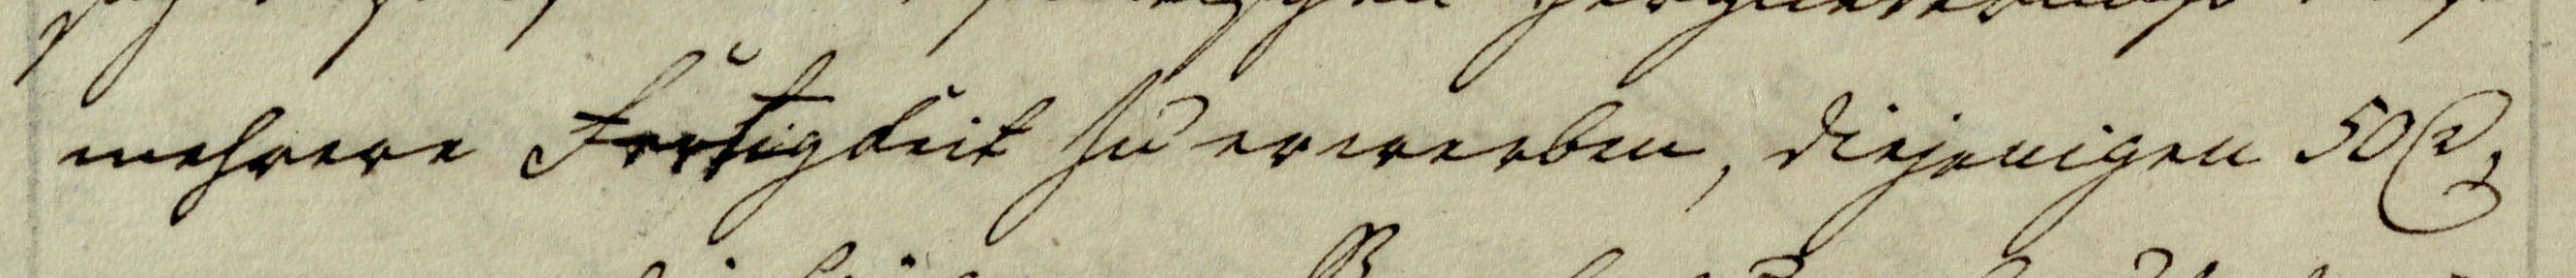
mehrere Fertigkeit zu erwerben, diejenigen 50 l.
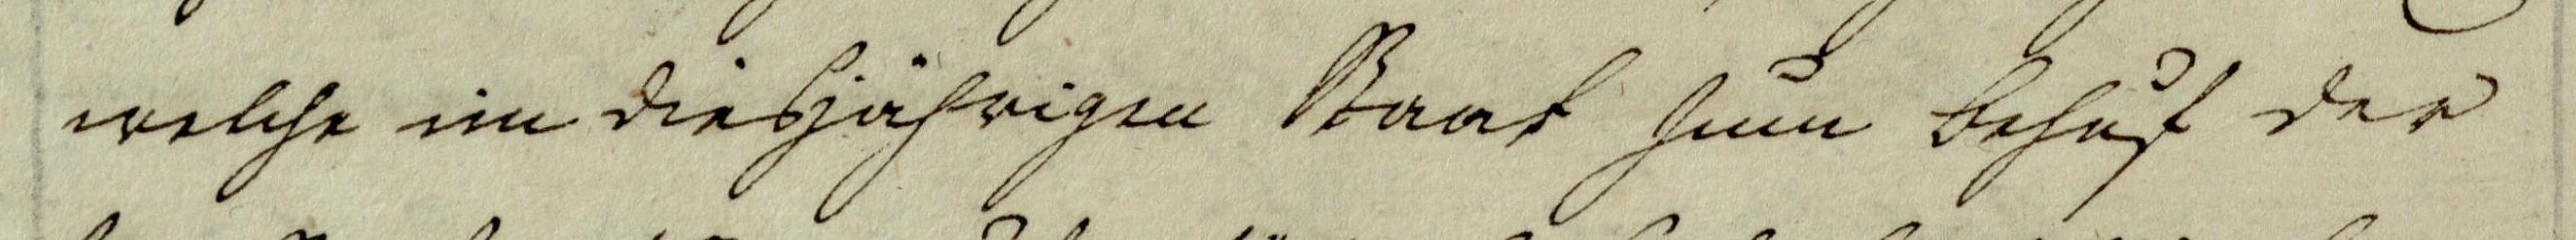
welche im diesjährigen Staat zum Behuf der
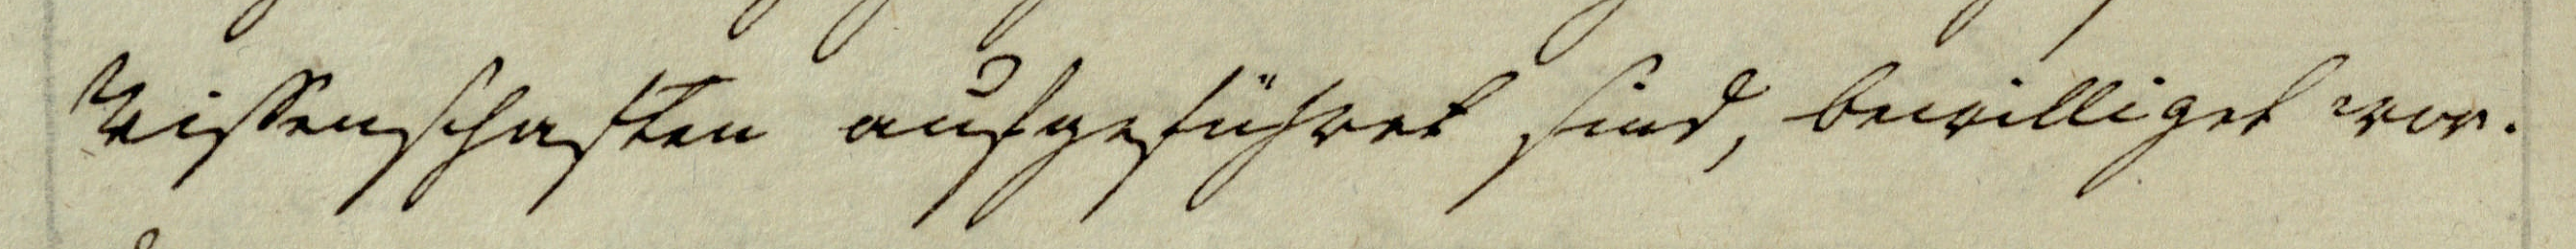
Wissenschaften aufgeführet sid, bewilliget wor¬
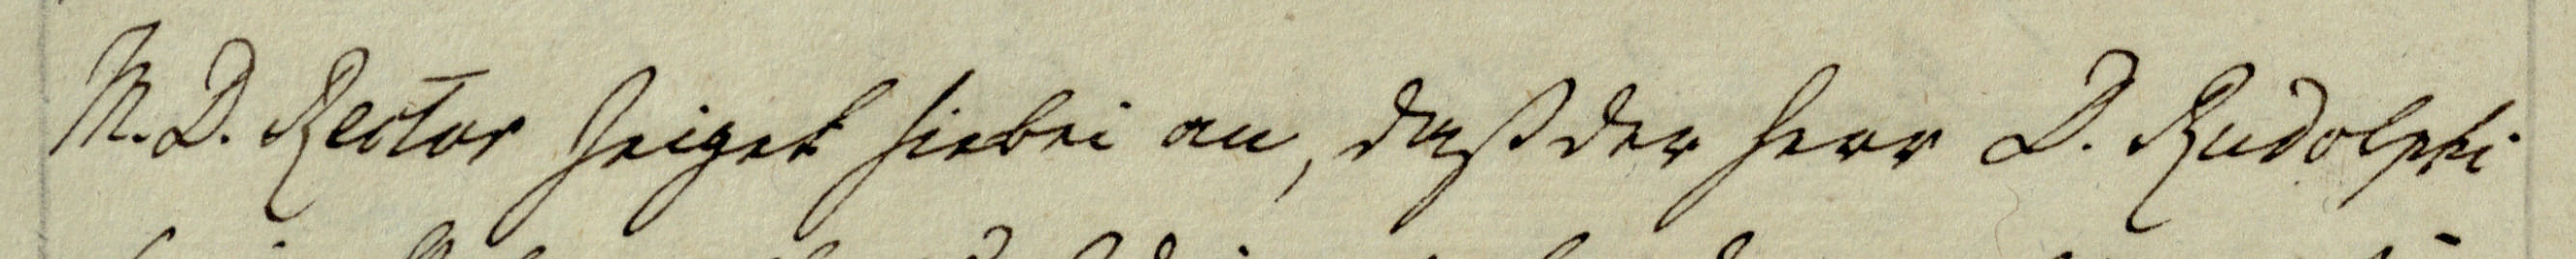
M. Rector zeiget hiebei an, daß der Herr D. Rudolphi
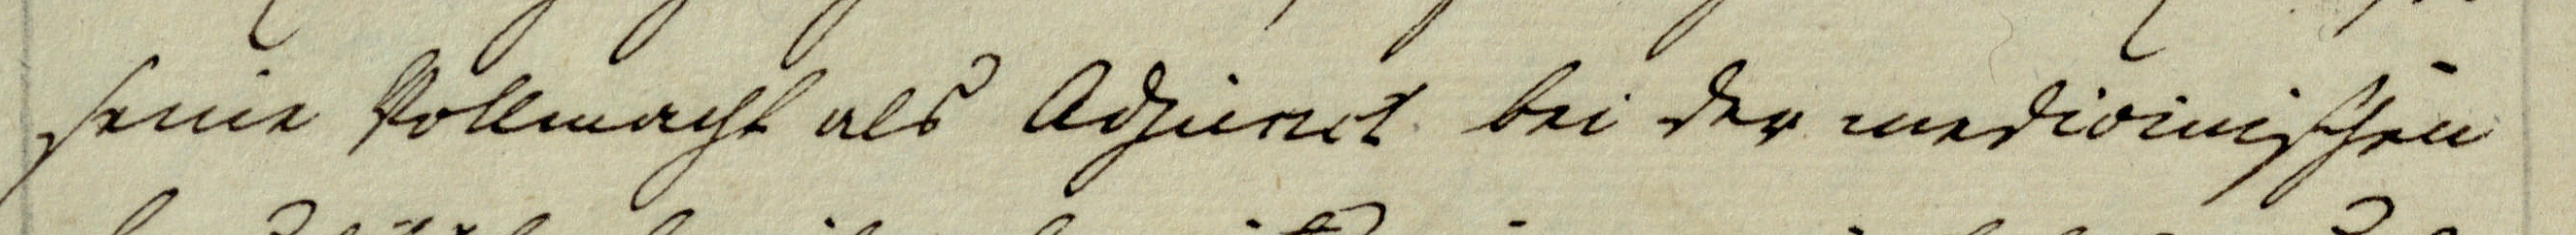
seine Vollmacht als Adjunct bei der medicinischen
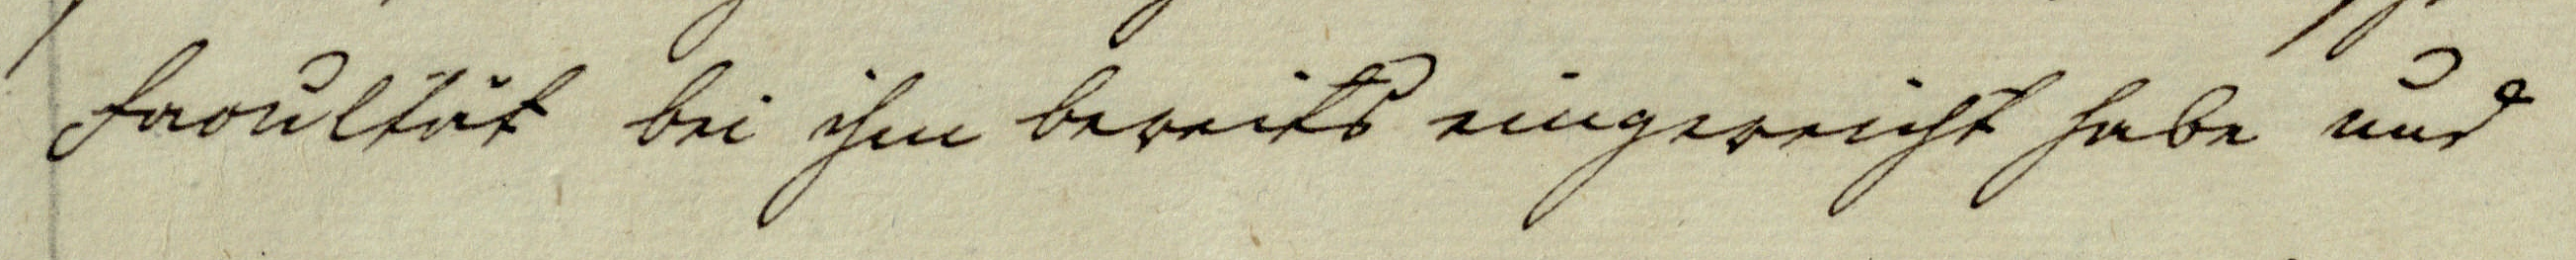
Facultät bei ihm bereits eingereicht habe und
